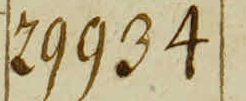29934
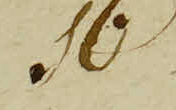16
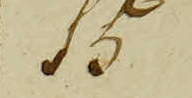15
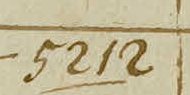5212
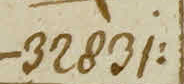32831
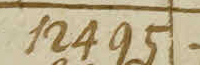12495
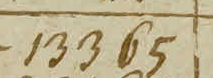13365
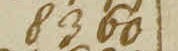8360
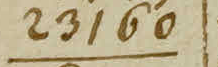23160
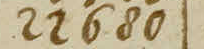22680
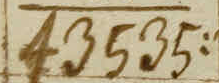43535
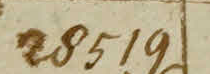28519
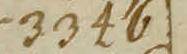3346
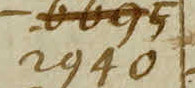2940
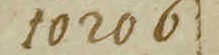10206
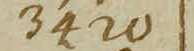3420
